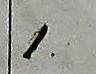1.
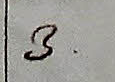3.
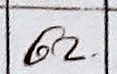62.
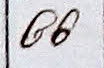66
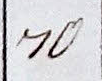70
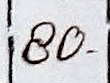80
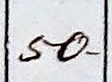50
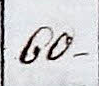60
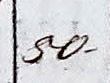50
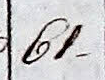61
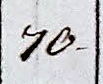70
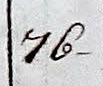76
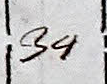34
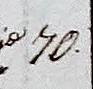70.
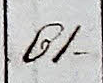61
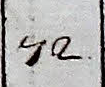72.
